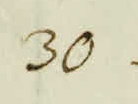30
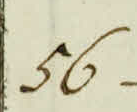56
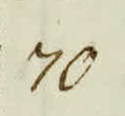70
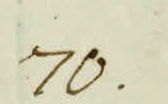70.
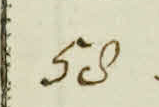58
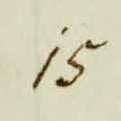15
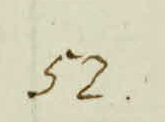52.
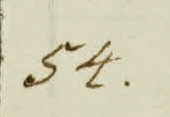54.
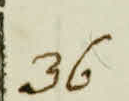36
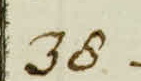38
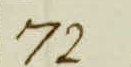72
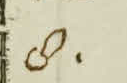8.
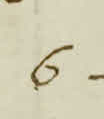6
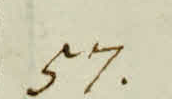57.
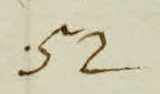52
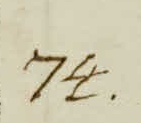74.
